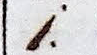1.
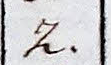2.
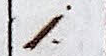1.
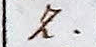2
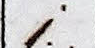1.
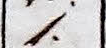1.
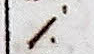1.
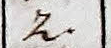2.
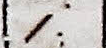1.
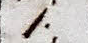1.
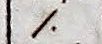1.
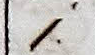1.
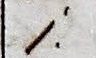1.
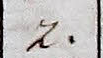2.
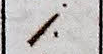1.
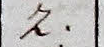2.
